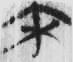宋
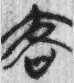客
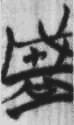盛
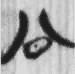公
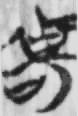甹（聘）
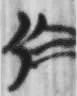於
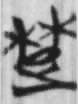楚
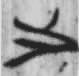之
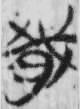歲（歲）
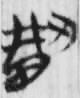荊（荆）
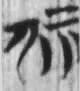𫵖
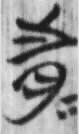之月
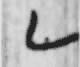乙
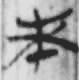未
